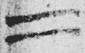二
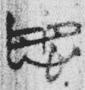悔
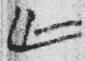亡
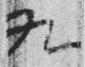九
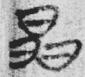晶
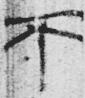不
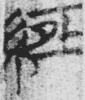恆
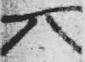亓（其）
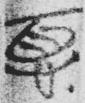惪（德）
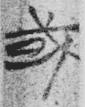或
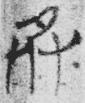丞（承）
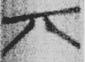亓（其）
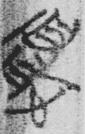○（羞）
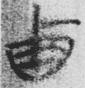貞
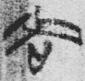吝
